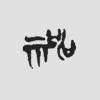神
